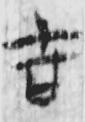吉
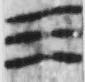三
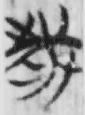歲（歲）
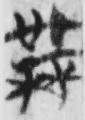無
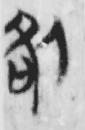咎
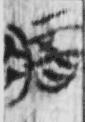𨟻（將）
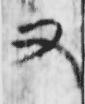又（有）
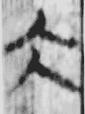大
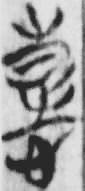憙（喜）
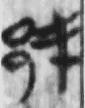邦
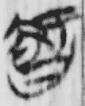智（知）
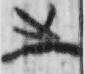之
